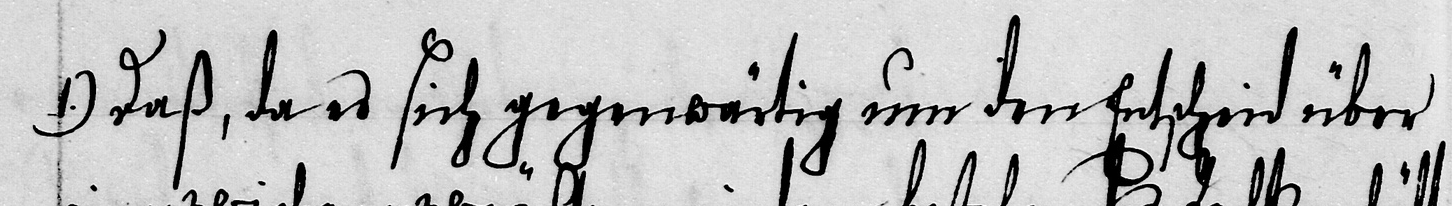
1.) Daß, da es sich gegenwärtig um den Entscheid über
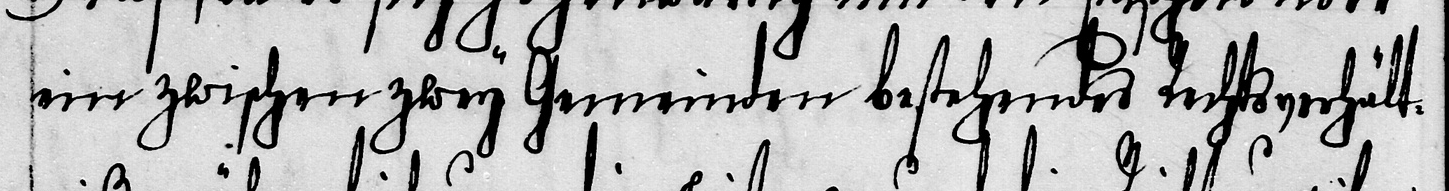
eine zwischen zwey Gemeinden bestehendes Rechtsverhält¬
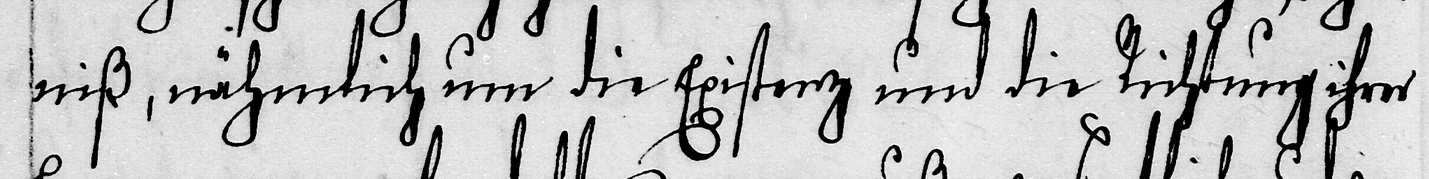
niß, nämlich um die Existenz und die Richtung ihrer
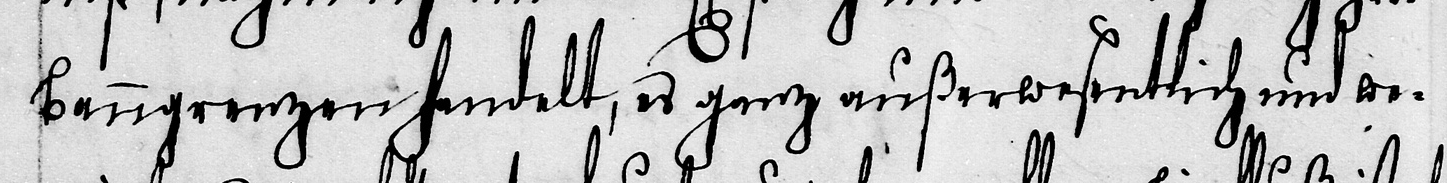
Banngrenzen handelt, es ganz außerordentlich und we¬
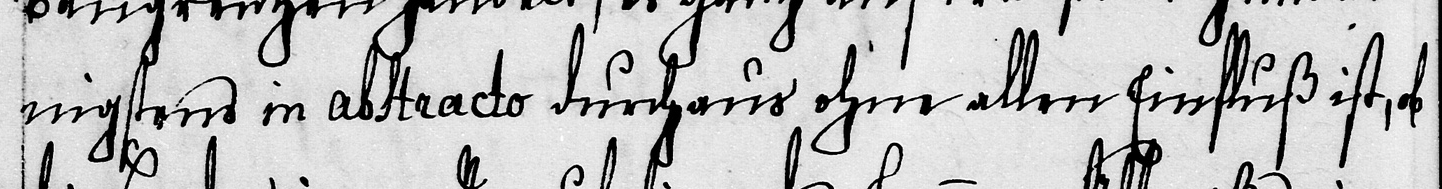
nigstens in abstracto durchaus ohne allen Einfluß ist,
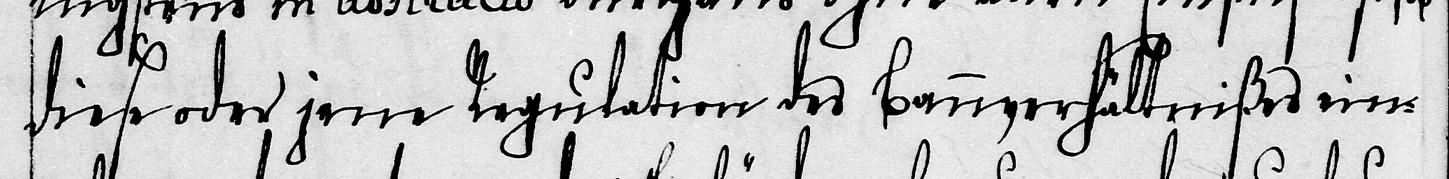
diese oder jene Regulation des Bannverhältnißes ein¬
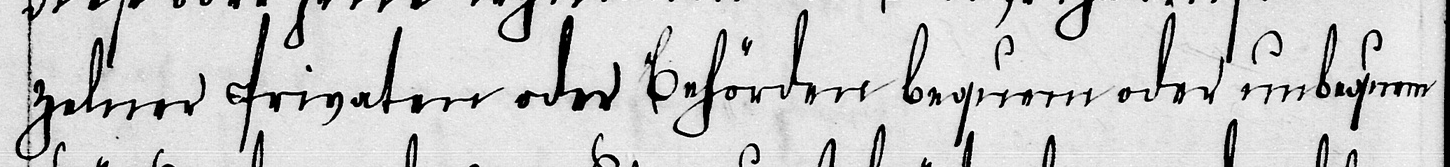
zelner Privaten oder Behörden bequem oder unbequem
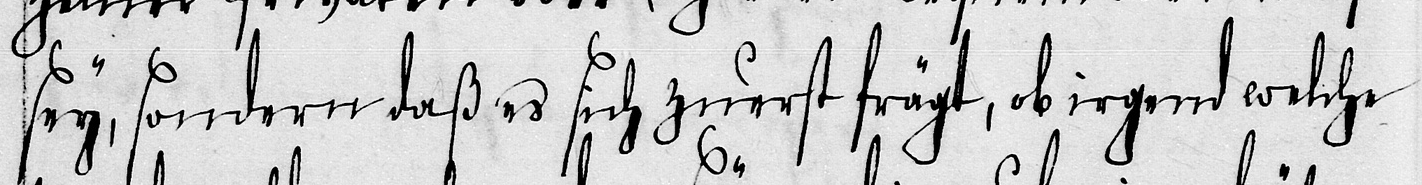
sey, sondern daß es sich zuerst frägt, ob irgend welche
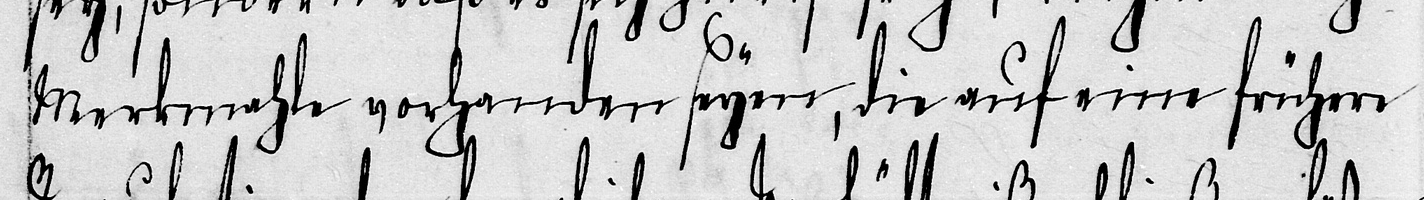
Merkmahle vorhanden seyen, die auf eine frühere
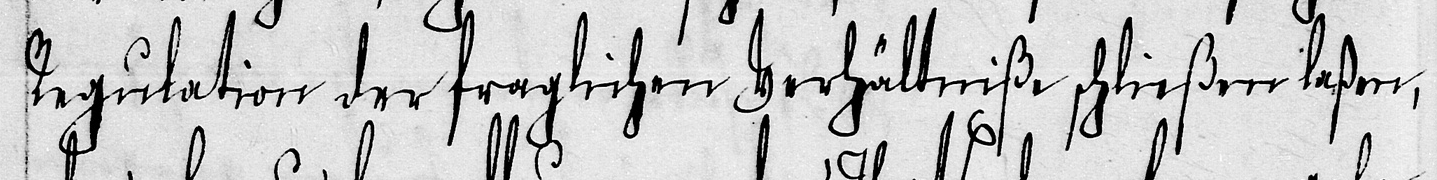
Regulation der fraglichen Verhältniße schließen laßen,
